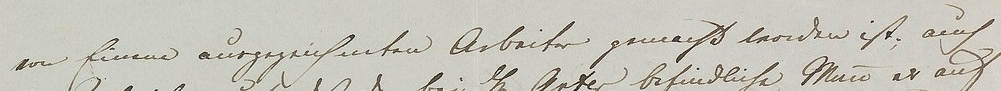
von Einem ausgezeichneten Arbeiter gemacht worden ist; auch
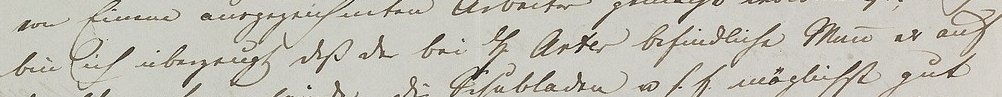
bin ich überzeugt, daß der bei H. Arter befindliche Mann es auf
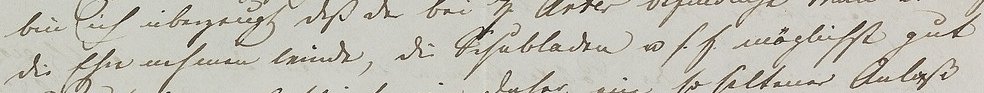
die Ehre nehmen würde, die Schubladen us. f. möglichst gut
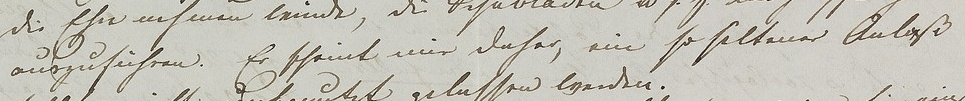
auszuführen. Es scheint mir daher, ein so seltener Anlaß
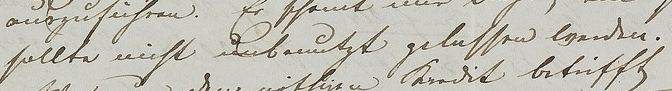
sollte nicht unbenutzt gelassen werden.
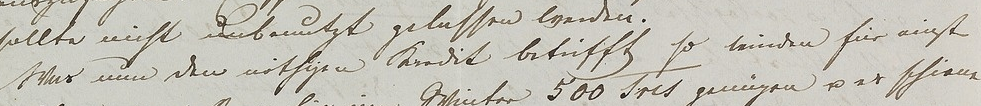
Was nun den nöthigen Kredit betrifft, so würden für einst-
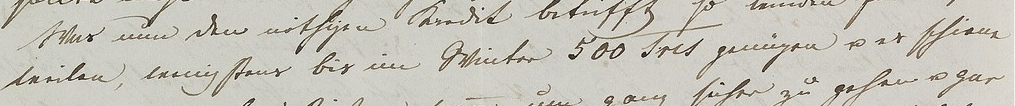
weilen, wenigstens bis im Winter 500 Frcs genügen & es schiene
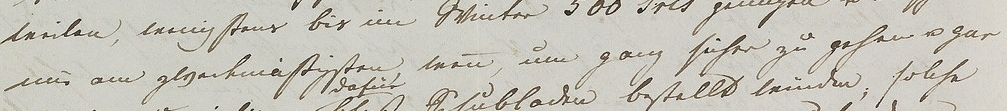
mir am zweckmäßigsten, wenn, um ganz sicher zu gehen & gar
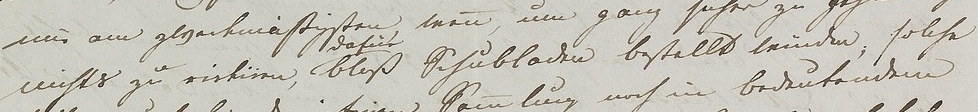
nichts zu riskiren, dafür bloß Schubladen bestellt würden, solche
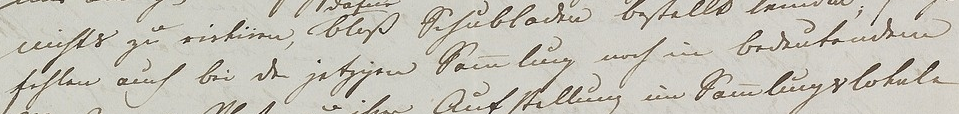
fehlen auch bei der jetzigen Sammlung noch in bedeutendem
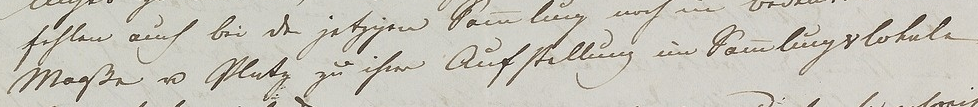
Maaße & Platz zu ihrer Aufstellung im Sammlungslokale
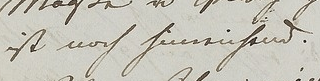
ist noch hinreichend.
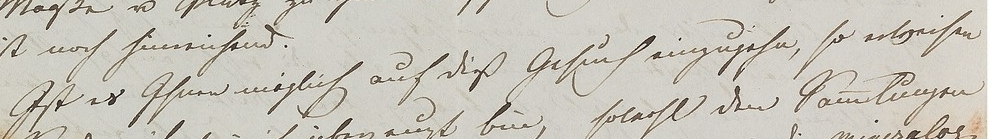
Ist es Ihnen möglich, auf dieß Gesuch einzugehn, so erweisen
